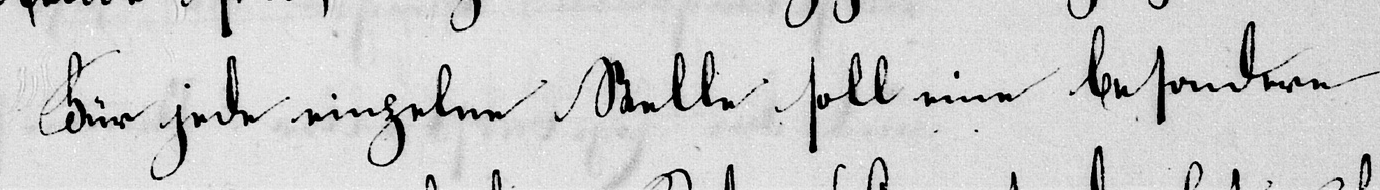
Für jede einzelne Stelle soll eine besondere
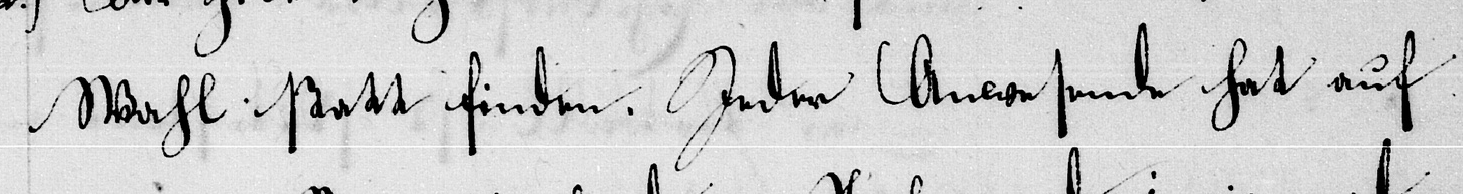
Wahl statt finden. Jeder Anwesende hat auf
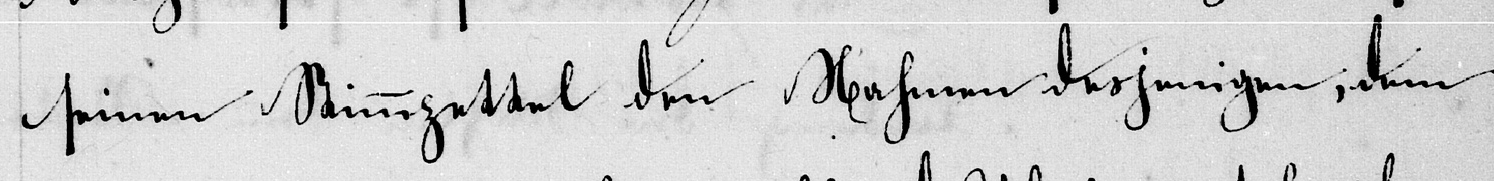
seinen Stimmzettel den Nahmen desjenigen, dem
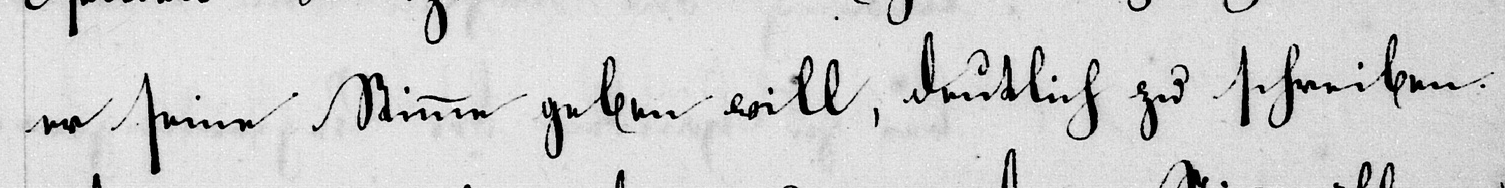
er seine Stimme geben will, deutlich zu schreiben.
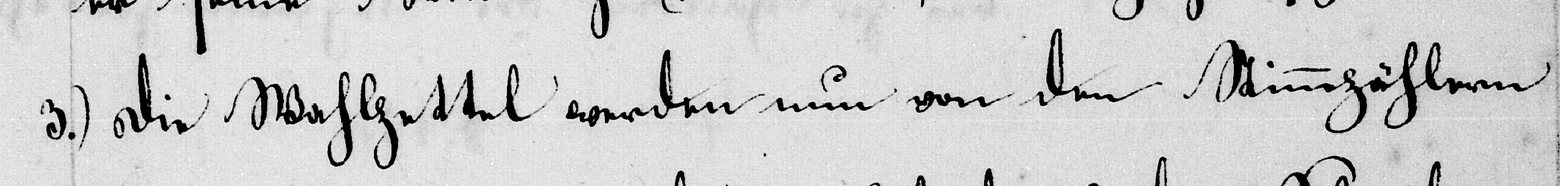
3.) Die Wahlzettel werden nun von den Stimmzählern
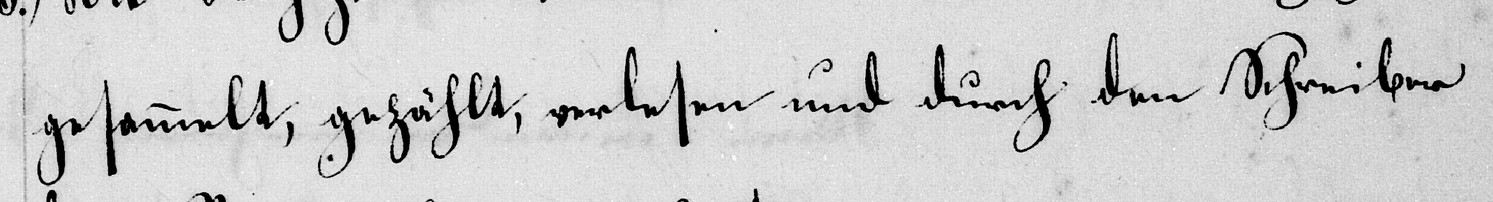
gesammelt, gezählt, verlesen und durch den Schreiber
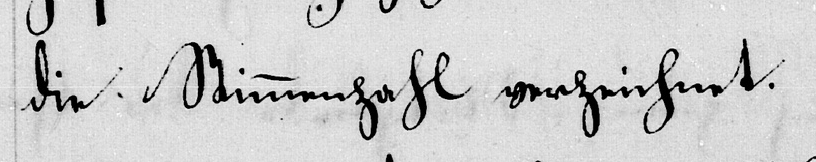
die Stimmenzahl verzeichnet.
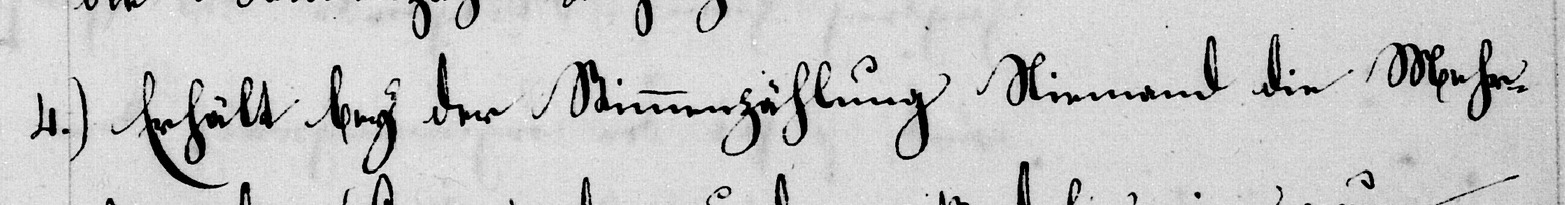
4.) Erhält bey der Stimmenzählung Niemand die Mehr¬
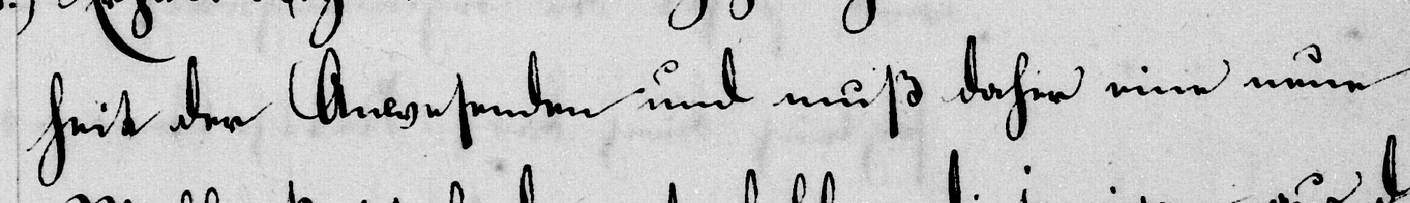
heit der Anwesenden und muß daher eine neue
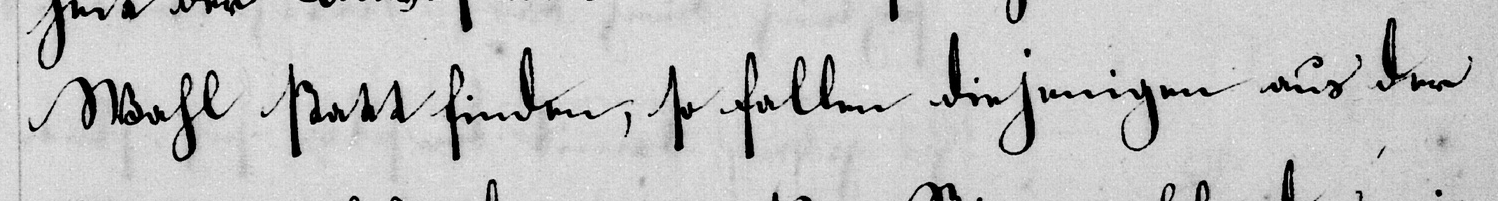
Wahl statt finden, so fallen diejenigen aus der
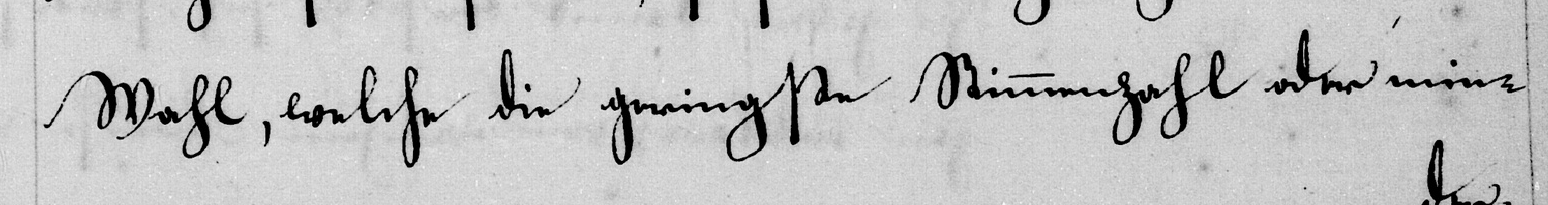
Wahl, welche die geringste Stimmenzahl oder min-
